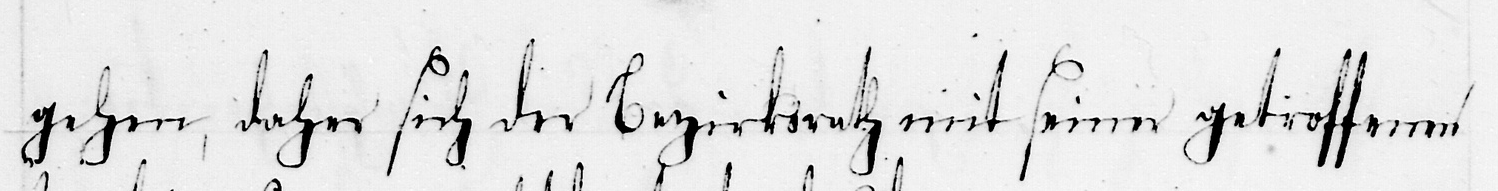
gehen, daher sich der Bezirksrath mit seiner getroffenen
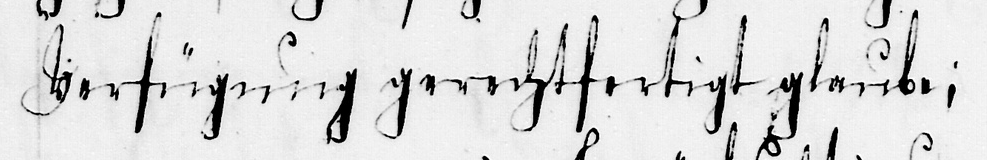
Verfügung gerechtfertigt glaube;
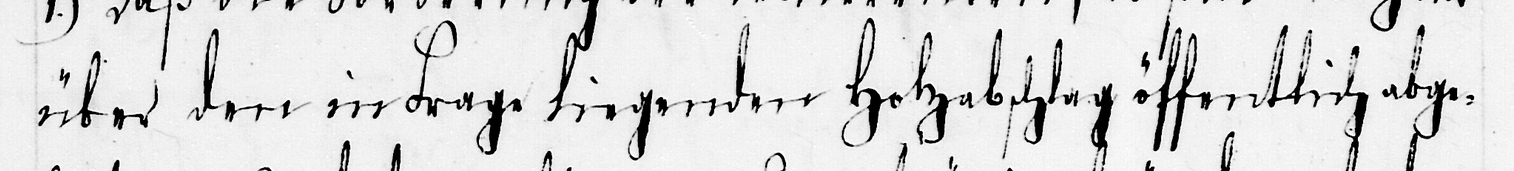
über den in Frage liegenden Holzabschlag öffentlich abg¬
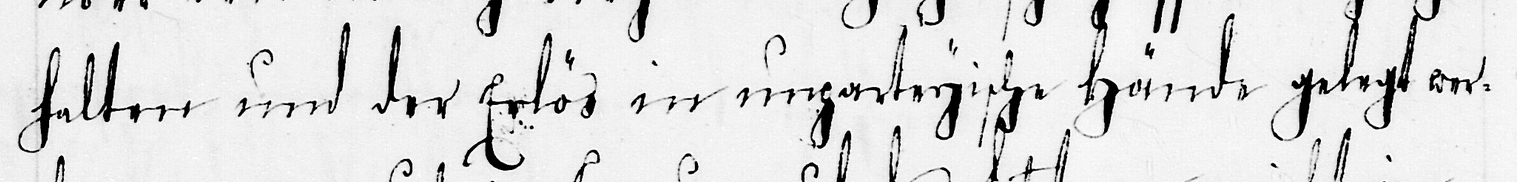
ehalten und der Erlös in unparteyische Hände gelegt wer¬
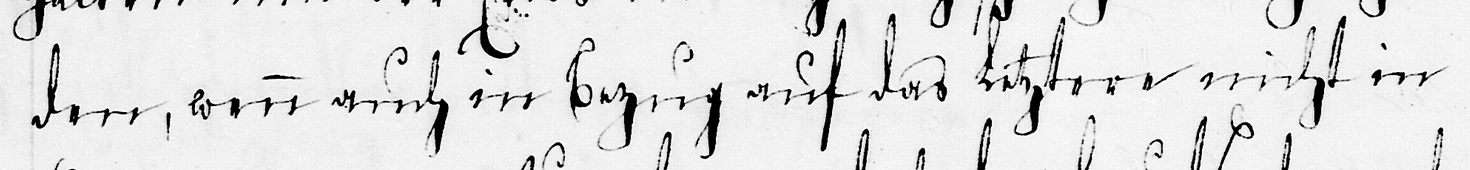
den, wenn auch in Bezug auf das Letztere nicht in
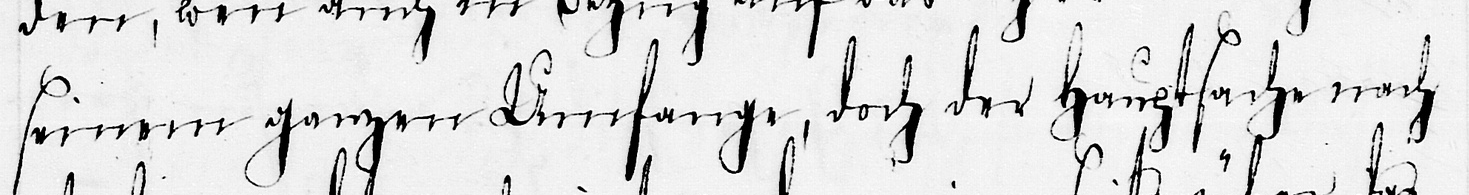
seinem ganzen Umfange, doch der Hauptsache nach
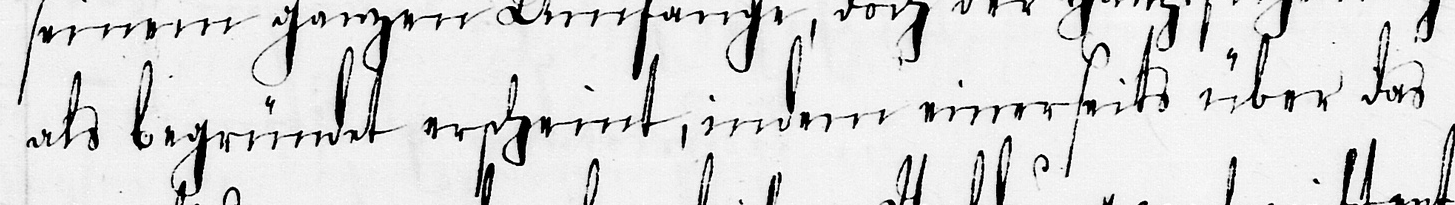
als begründet erscheint, indem einerseits über das
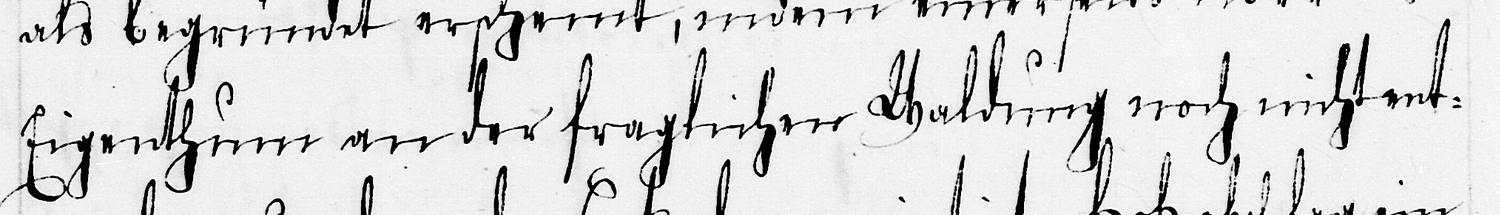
Eigenthum an der fraglichen Waldung noch nicht ent¬
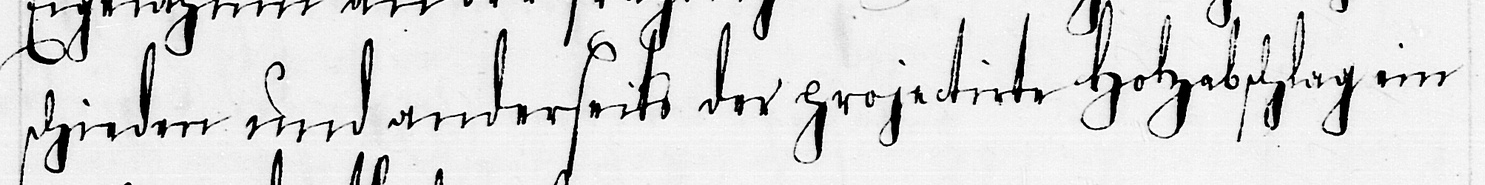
schieden und anderseits der projectirte Holzabschlag ein
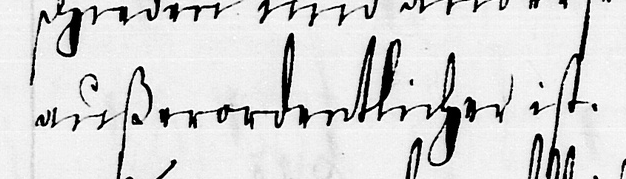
außerordentlicher ist.
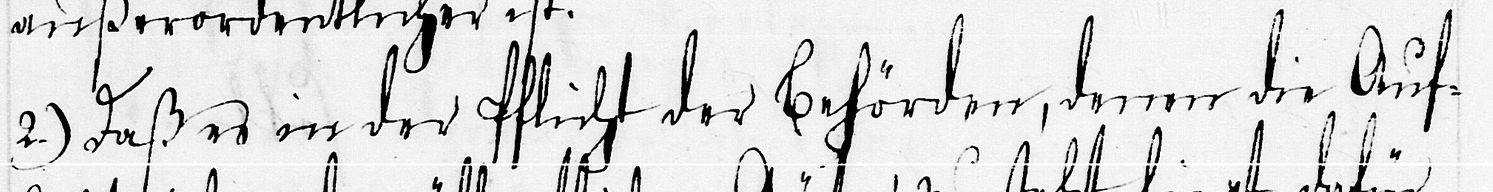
2.) Daß es in der Pflicht der Behörden, denen die Auf¬
